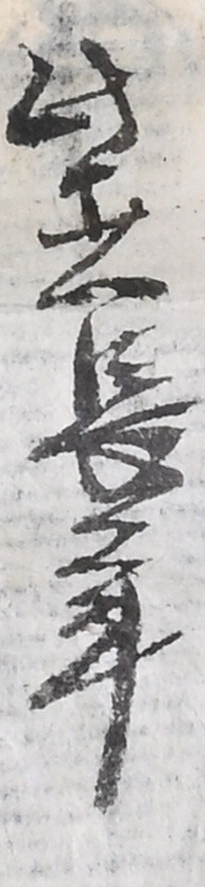此者長年

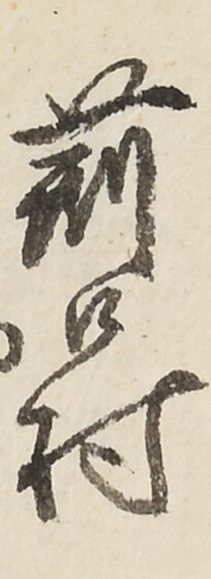荊口村
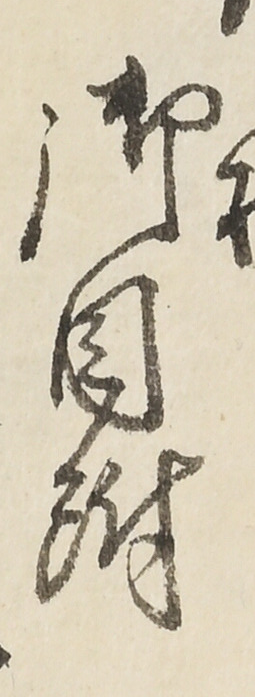御目附
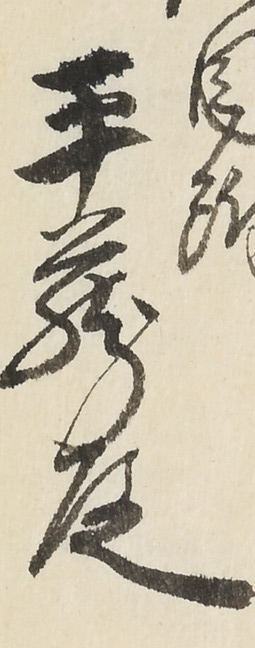平蔵殿
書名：安政七庚申年正月石切名前書上帳
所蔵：伊那市立高遠町図書館・合同会社AMANE
